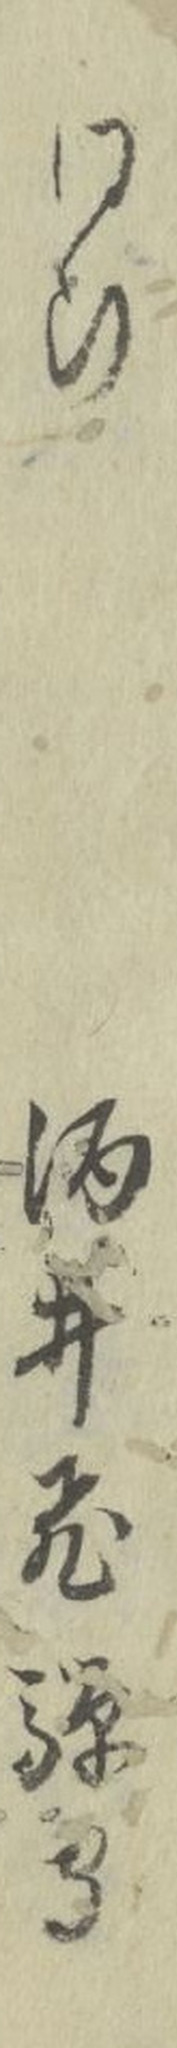同断酒井飛騨守
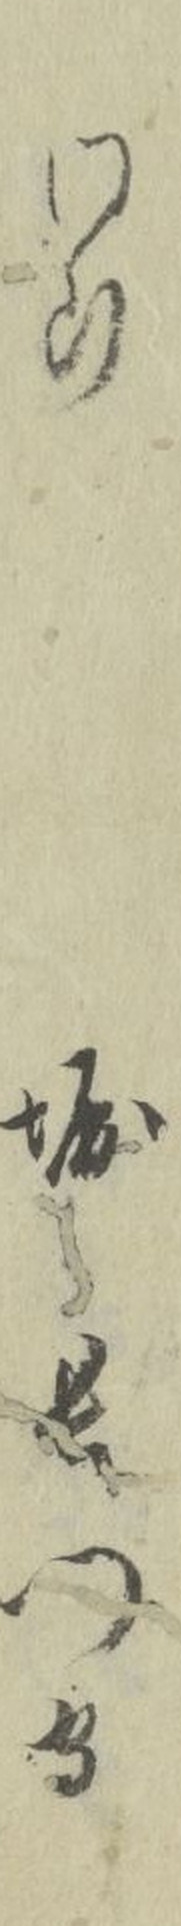同断堀長門守
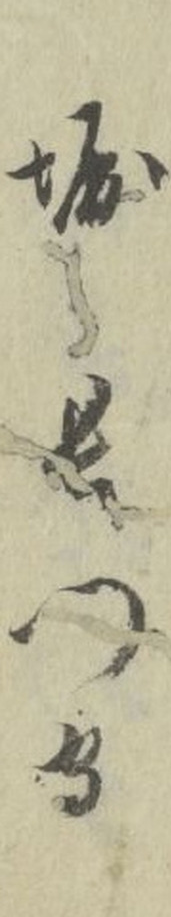同断堀長門守
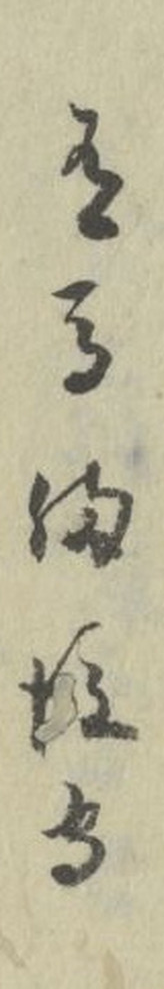同断有馬備後守
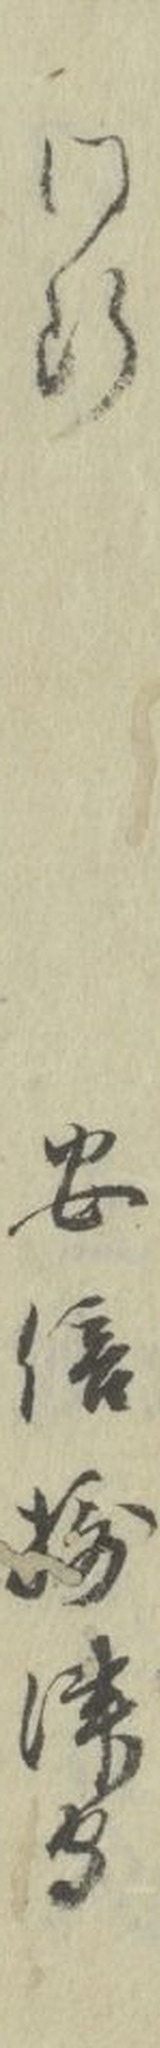同断安部摂津守
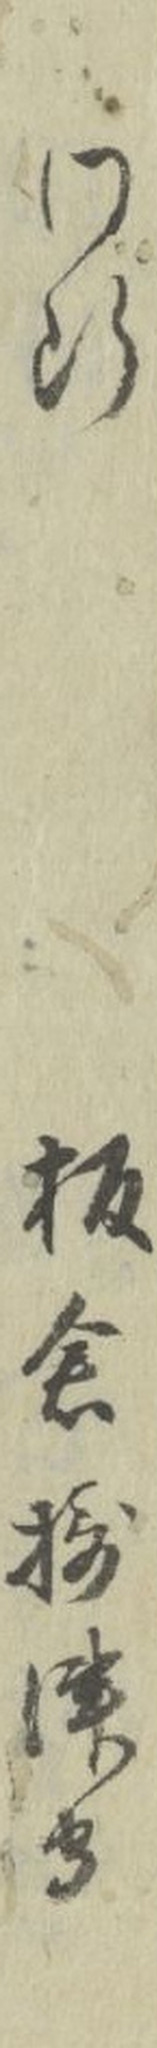同断板倉摂津守
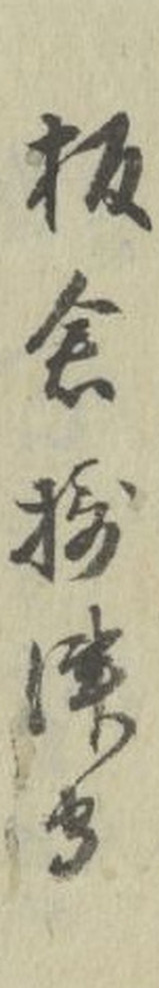同断板倉摂津守
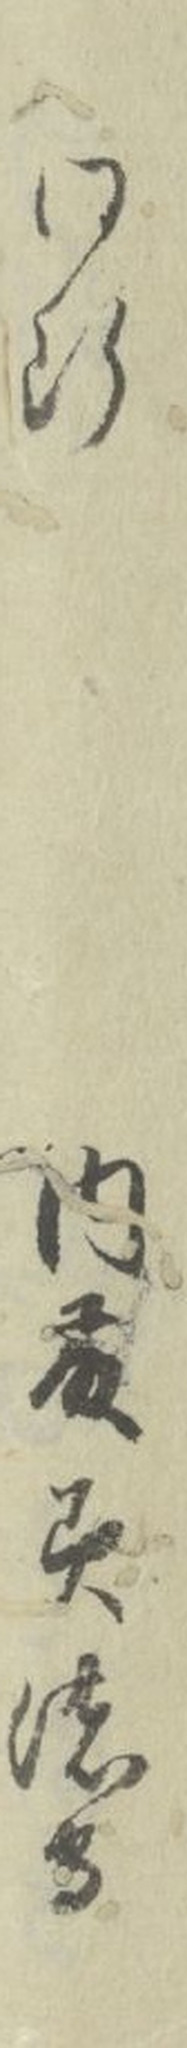同断内藤美濃守
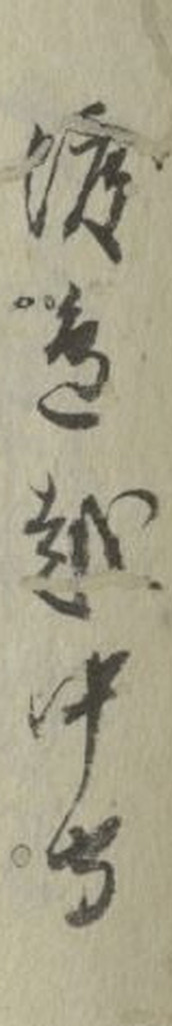同断渡辺越中守
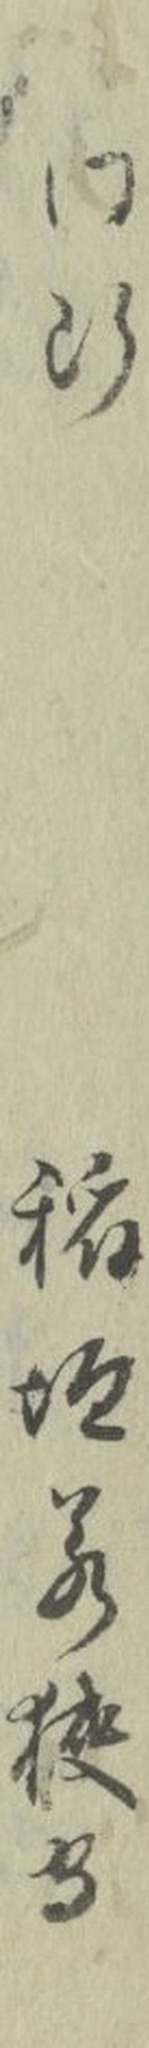同断稲垣若狭守
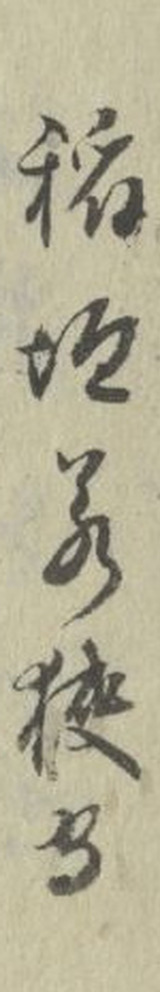同断稲垣若狭守
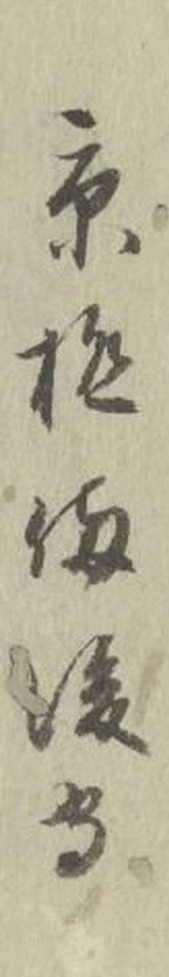同断京極備後守
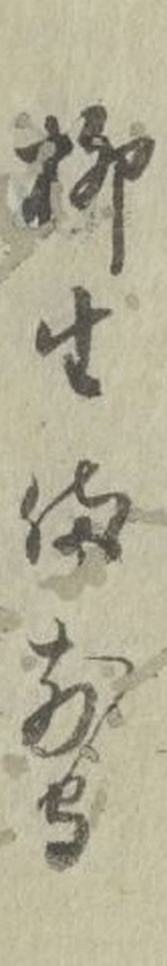同断柳生備前守

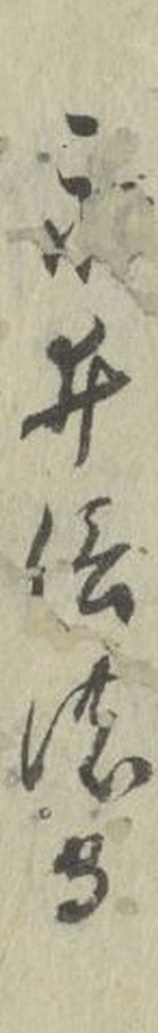同断永井信濃守
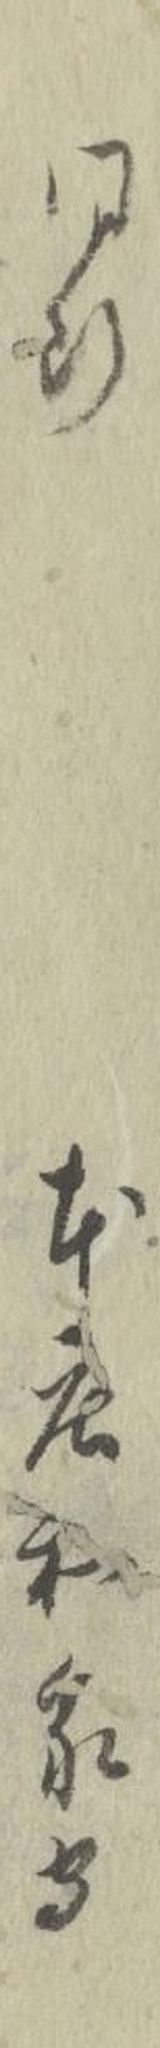同断本庄和泉守
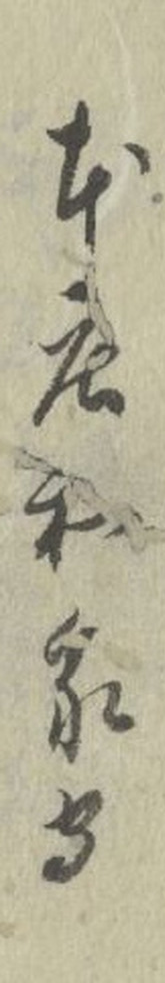同断本庄和泉守
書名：琉球来朝記 自一至七
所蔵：University of the Ryukyus Library
